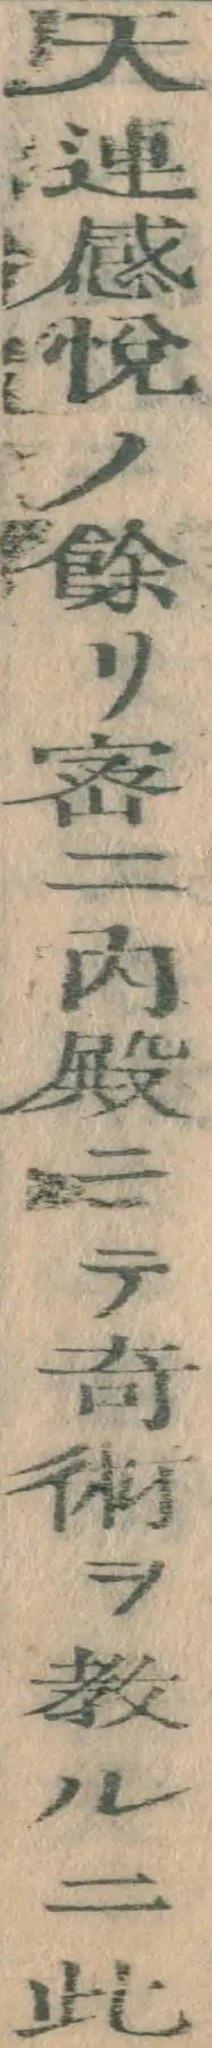天連感悦ノ余リ密ニ内殿ニテ奇術ヲ教ルニ此

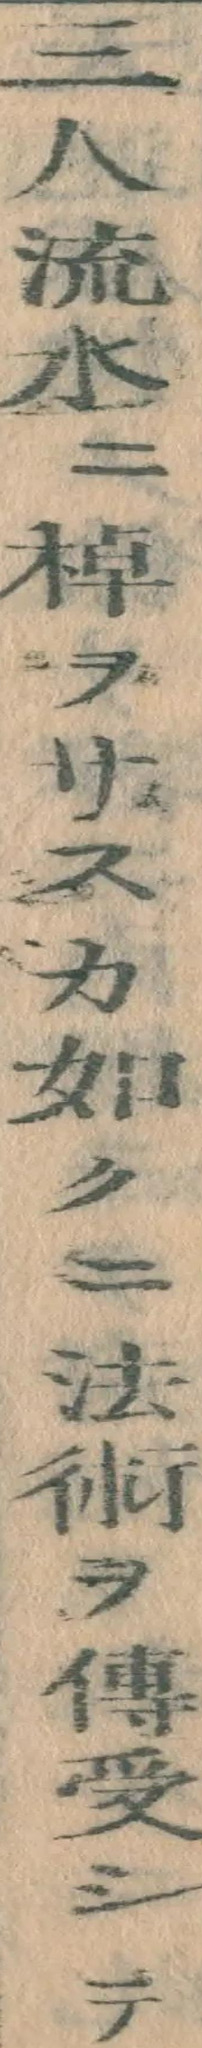三人流水ニ棹ヲサスカ如クニ法術ヲ伝受シテ
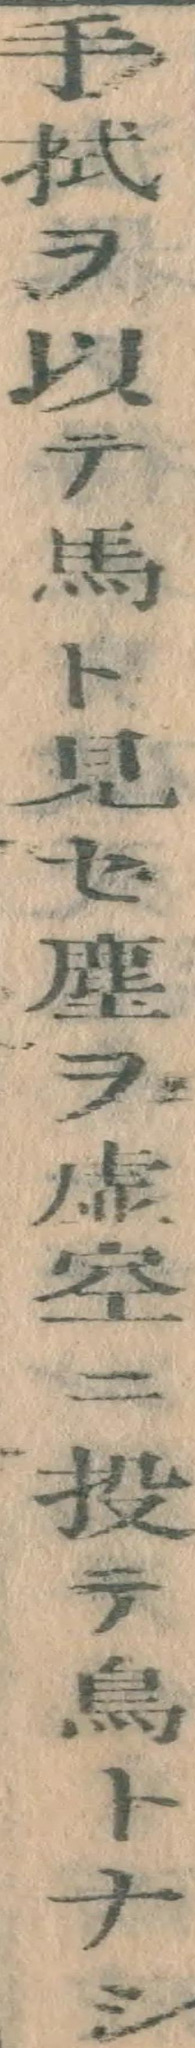手拭ヲ以テ馬ト見セ塵ヲ虚空ニ投テ鳥トナシ
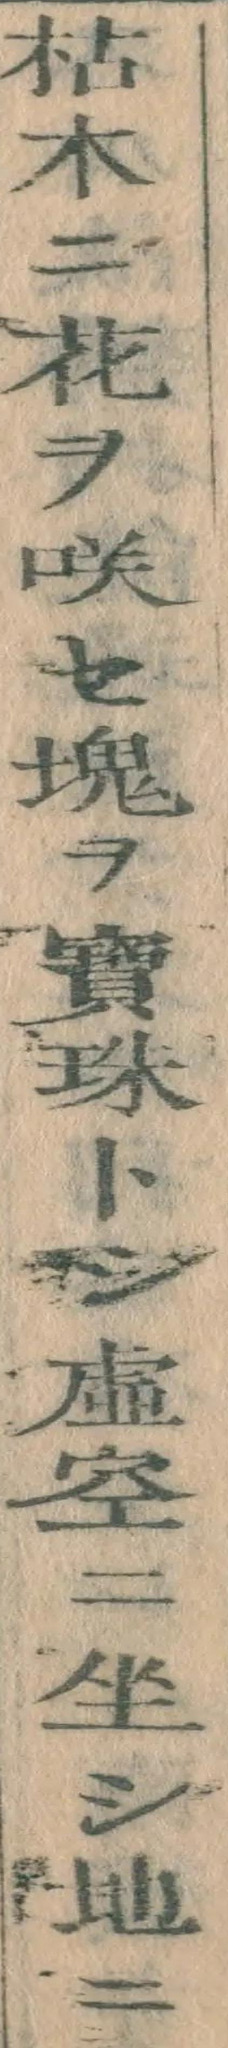枯木ニ花ヲ咲セ塊ヲ宝珠トシ虚空ニ坐シ地ニ
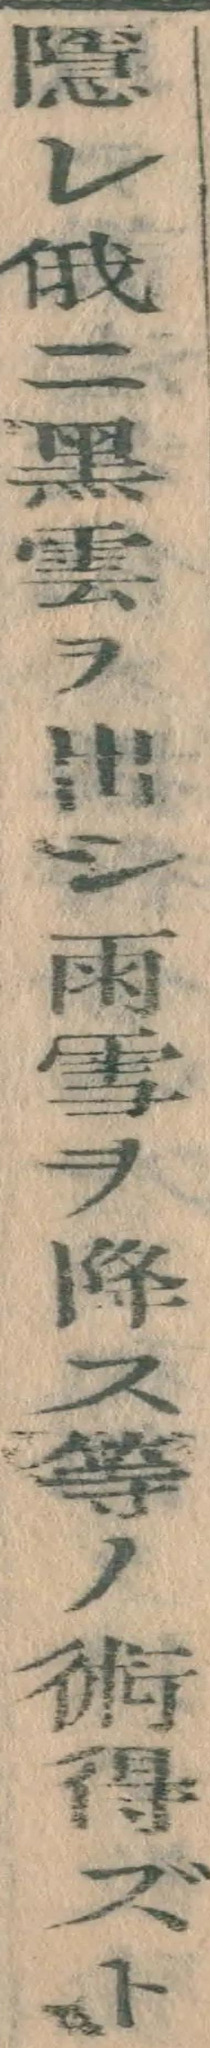隠レ俄ニ黒雲ヲ出シ雨雪ヲ降ス等ノ術得ズト
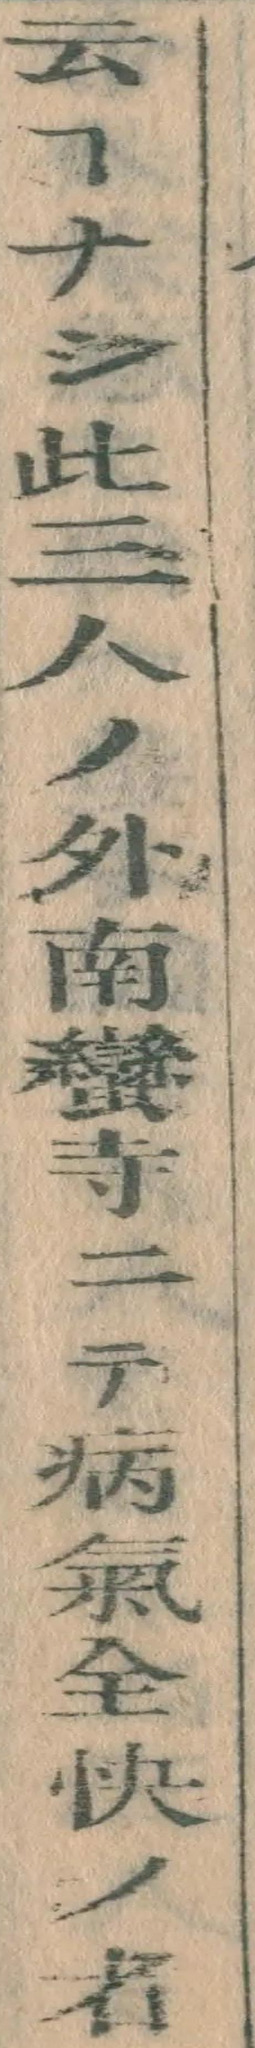云ヿナシ此三人ノ外南蛮寺ニテ病気全快ノ者
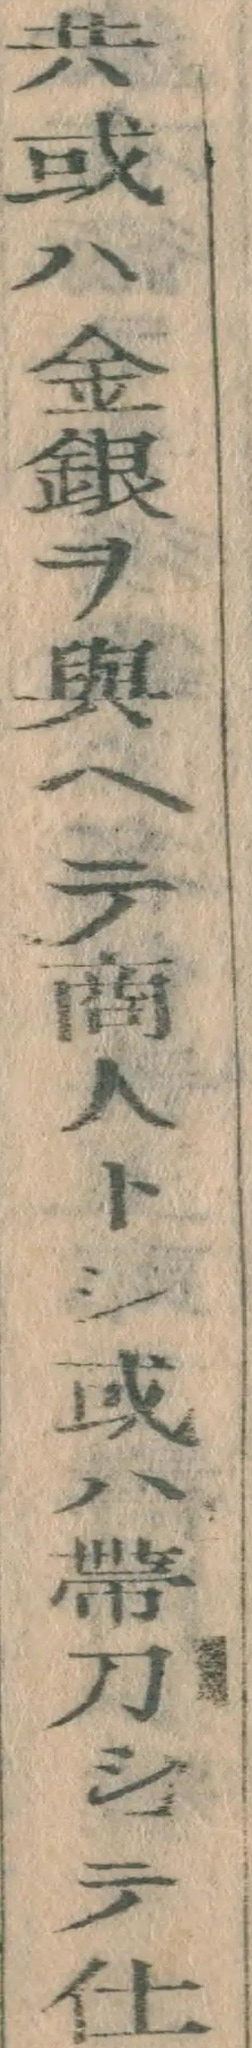共或ハ金銀ヲ与ヘテ商人トシ或ハ帯刀シテ仕
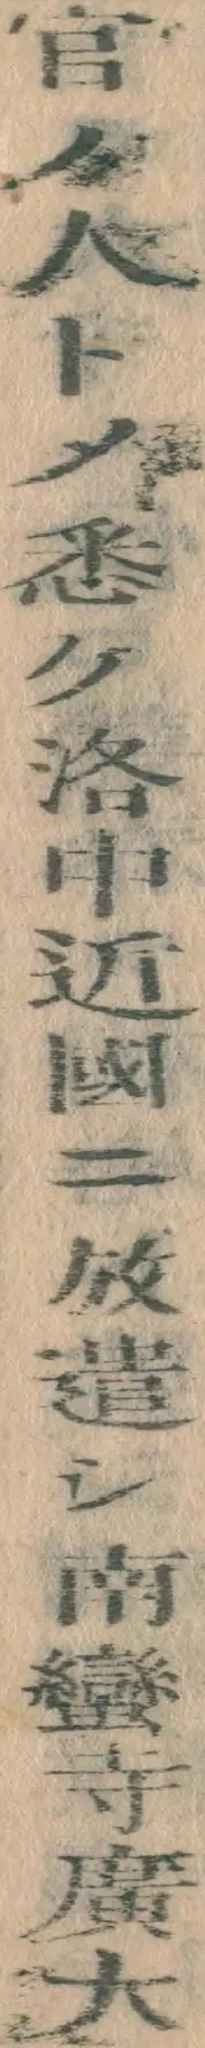官ノ人トシテ悉ク洛中近国ニ放遣シ南蛮寺広大
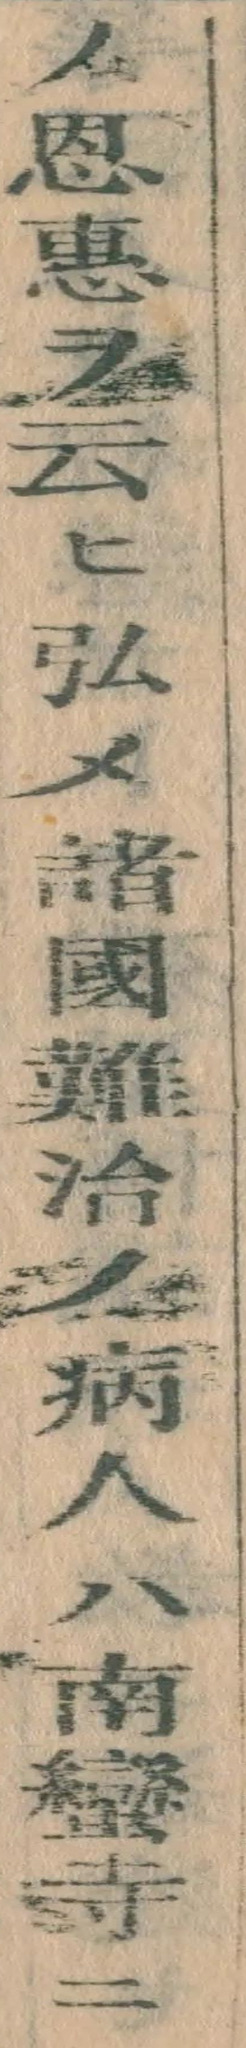ノ恩恵ヲ云ヒ弘メ諸国難治ノ病人ハ南蛮寺ニ
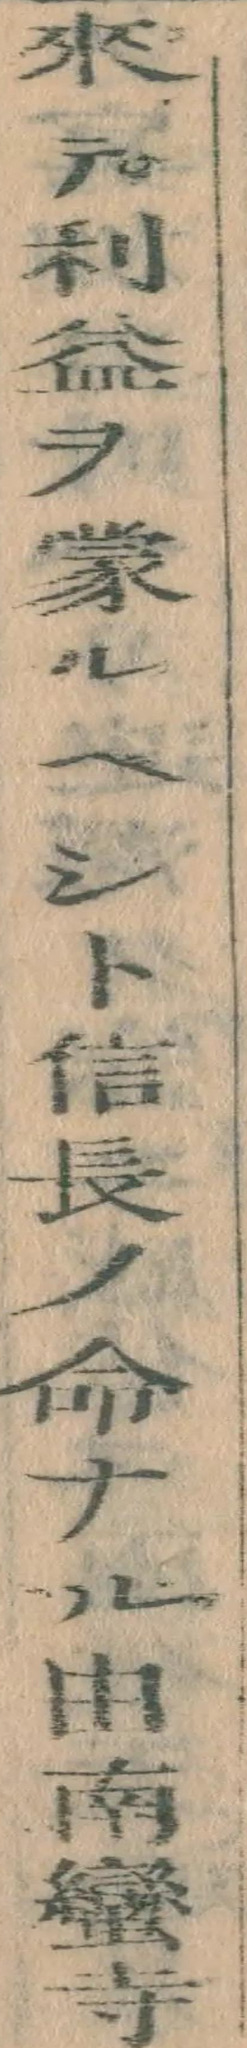来テ利益ヲ蒙ルヘシト信長ノ命ナル由南蛮寺
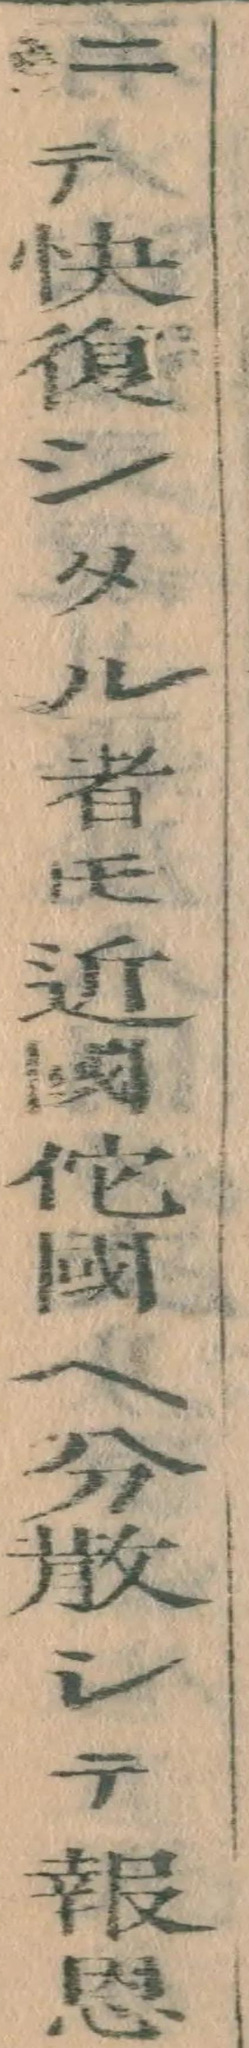ニテ快復シタル者トモ近国佗国ヘ分散シテ報恩
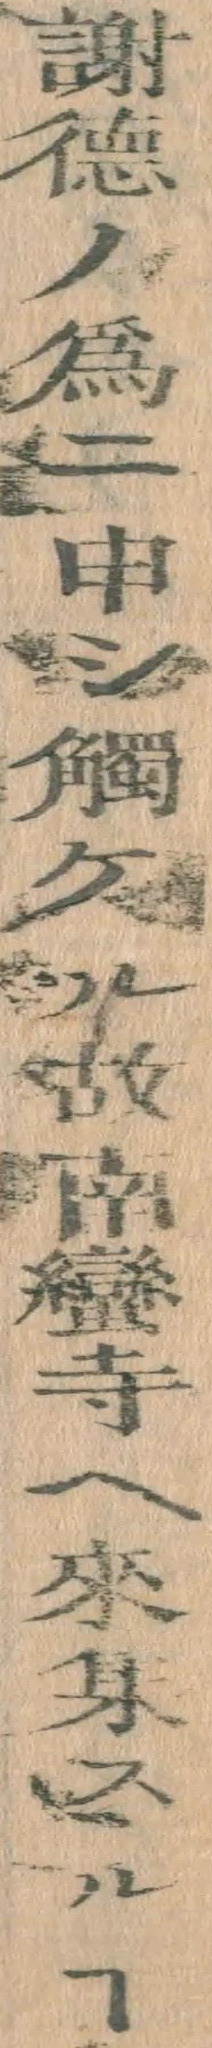謝徳ノ為ニ申シ触ケル故南蛮寺ヘ来集スルヿ
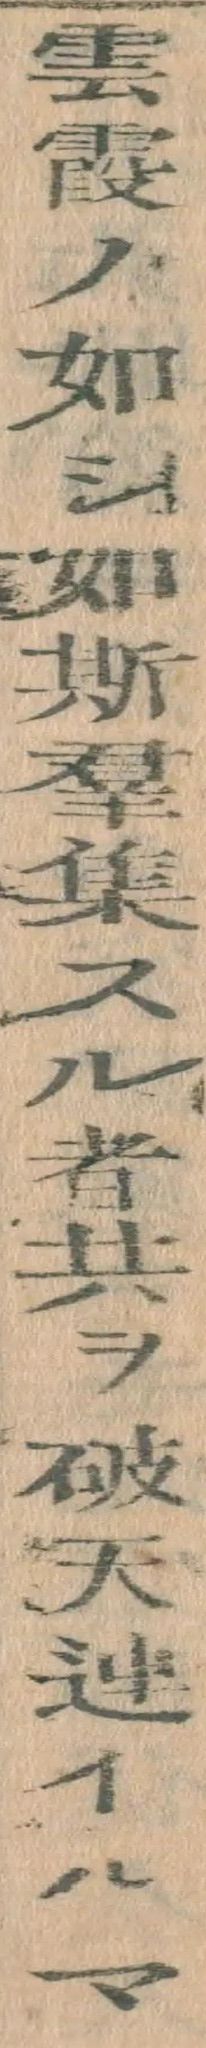雲霞ノ如シ如斯群集スル者共ヲ破天連イルマ
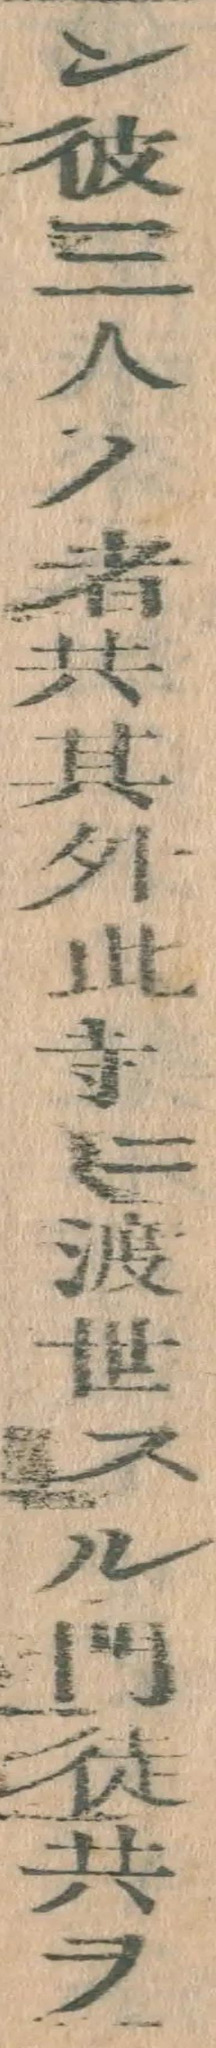ン彼三人ノ者共其外此寺ニ渡世スル門徒共ヲ
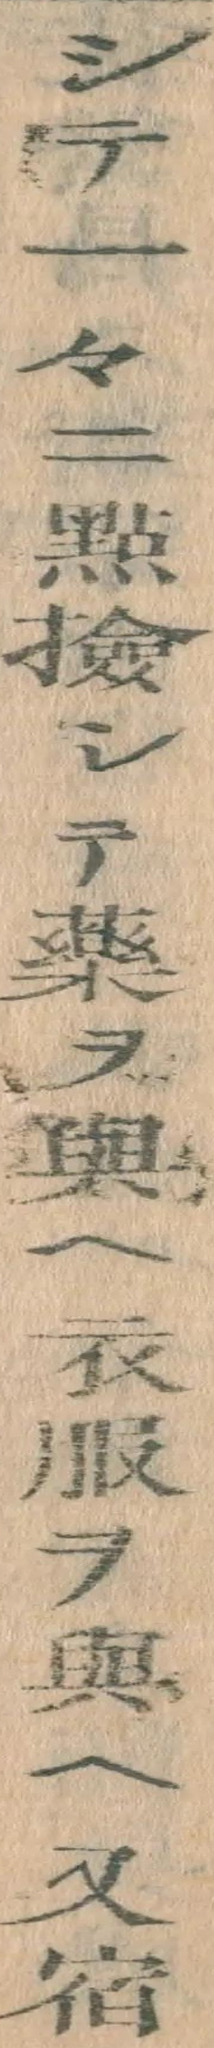シテ一々ニ点撿シテ薬ヲ与ヘ衣服ヲ与ヘ又宿
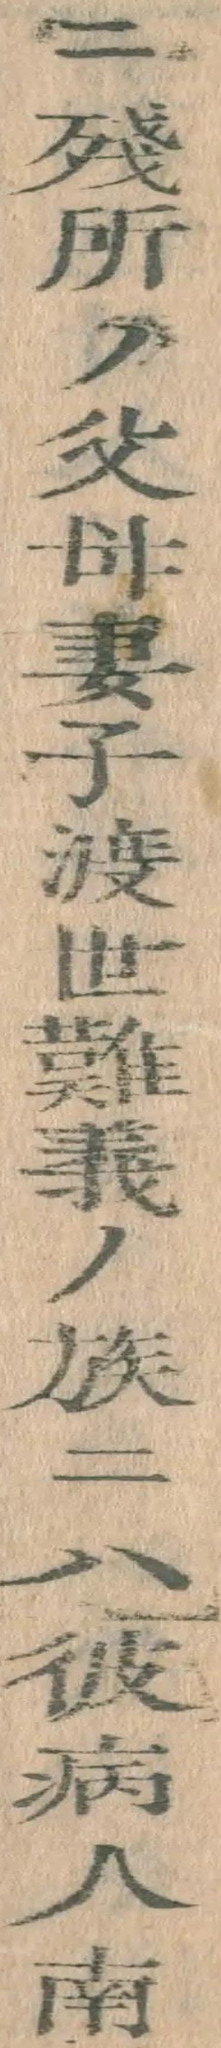ニ残所ノ父母妻子渡世難義ノ族ニハ彼病人南
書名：南蛮寺興廃記
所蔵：国立国会図書館 National Diet Library, JAPAN
